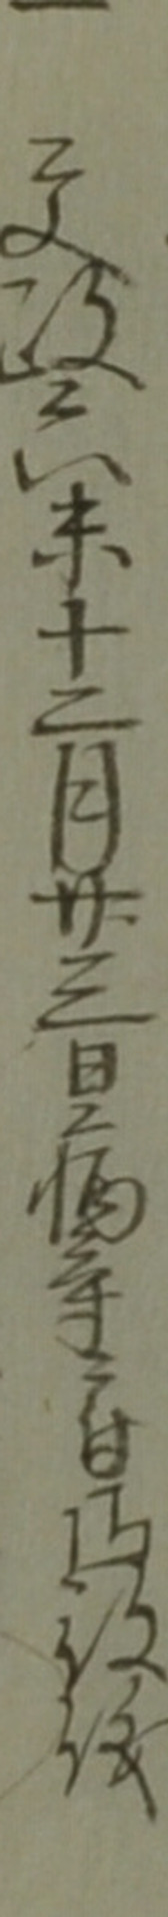一文政六未十二月廿三日病気ニ付御役儀
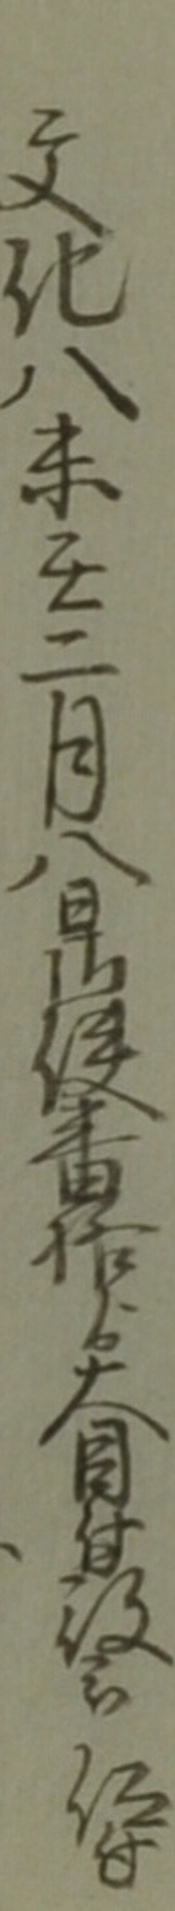一文化八未閏二月八日御使番格ゟ大目付役被仰付
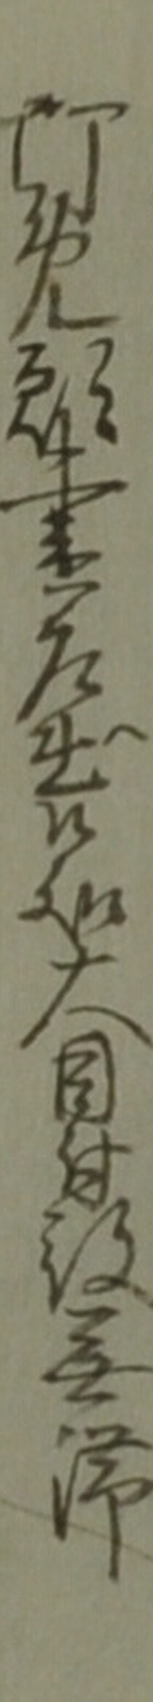御免願書差出候処大目付役無滞
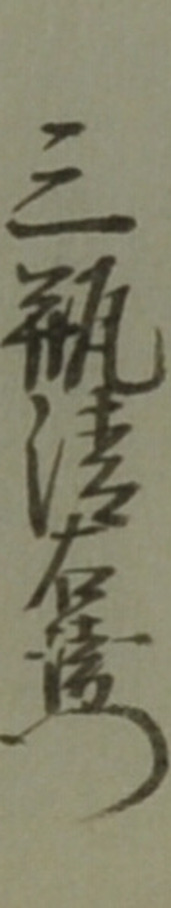三瓶清右衛門
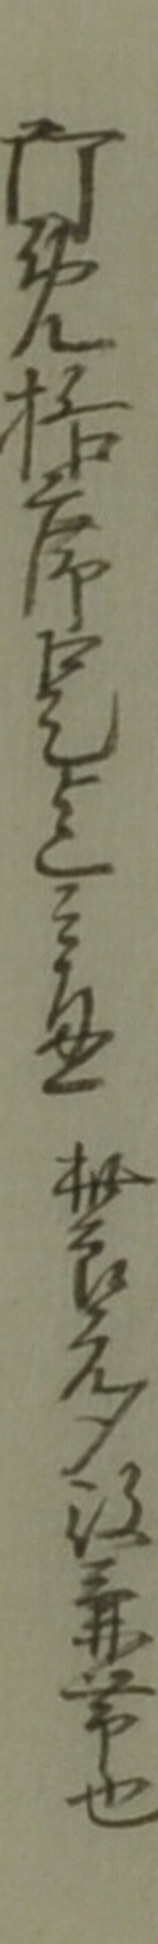御免格席是迄之通此節元〆役兼帯也
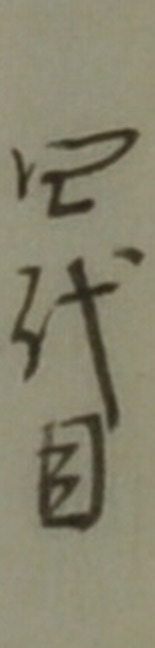四代目
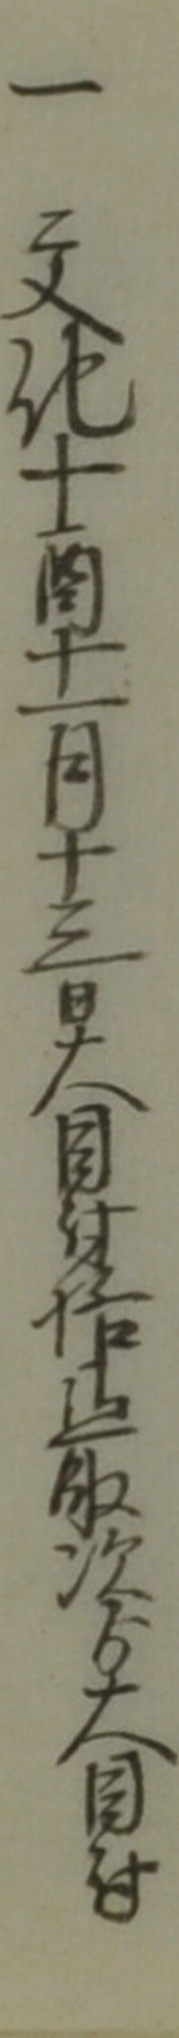一文化十酉十一月十三日大目付格御取次ゟ大目付
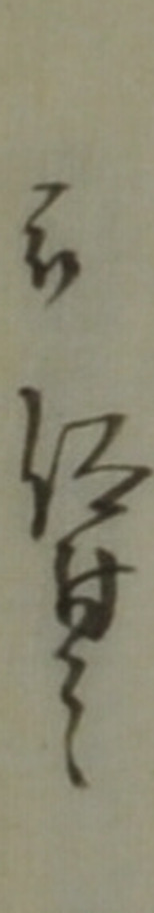被仰付之
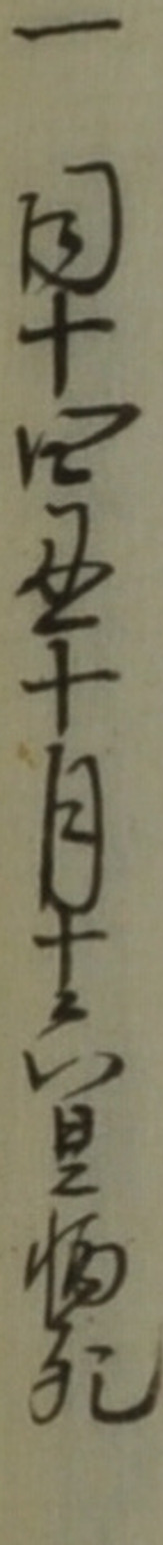一同十四丑十月十六日病死
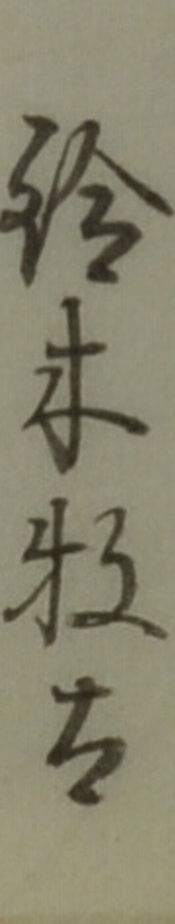鈴木牧太
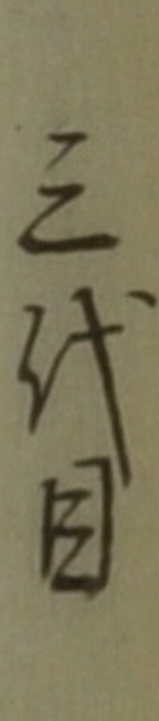三代目
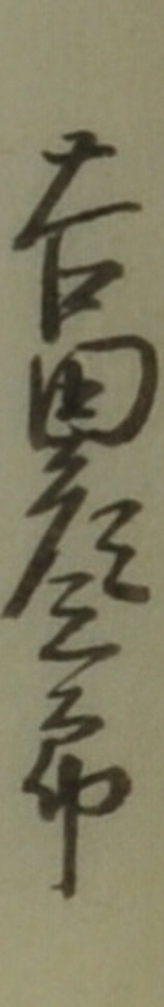吉田彦三郎
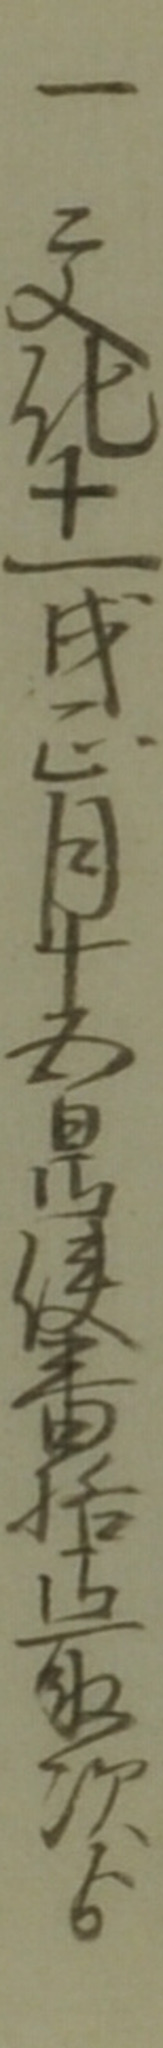一文化十一戌正月十五日御使番格御取次ゟ
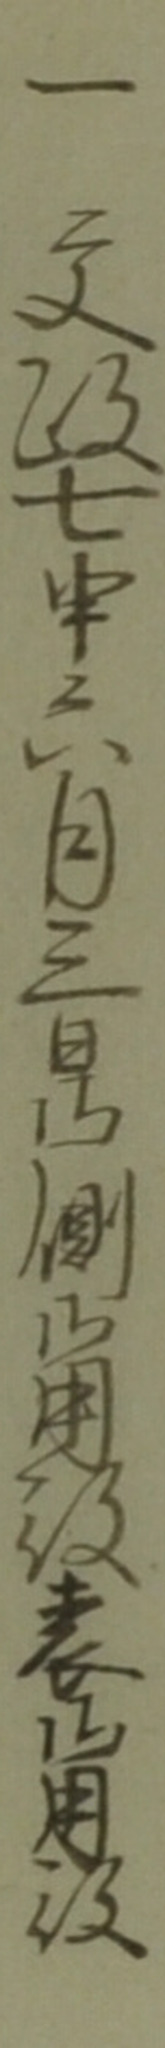一文政七六月三日御側御用役表御用役
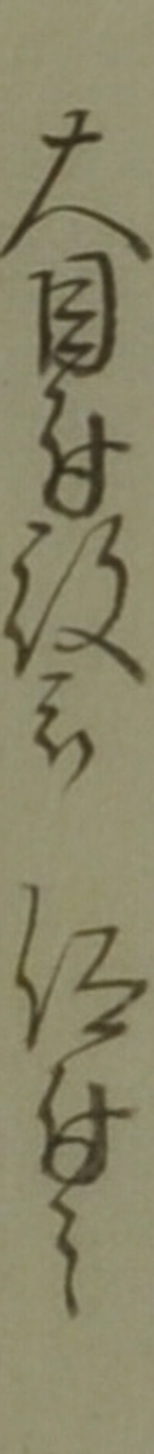御目付役被仰付之
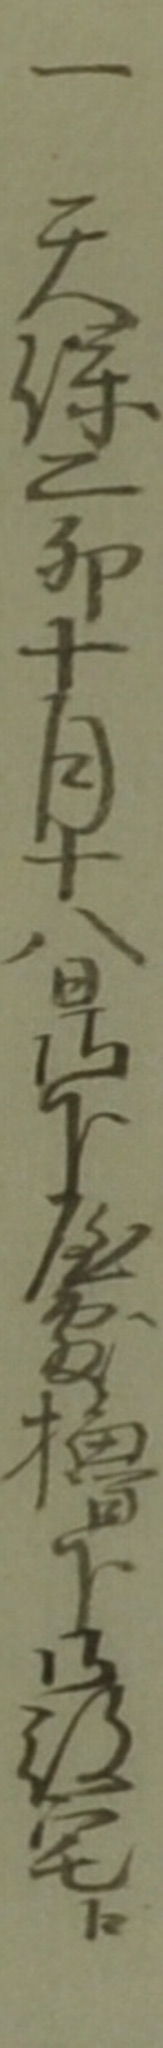一天保二卯十月十八日御下屋敷櫓下御役宅江
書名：諸御役代々録（三）
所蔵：伊那市立高遠町図書館・合同会社AMANE
